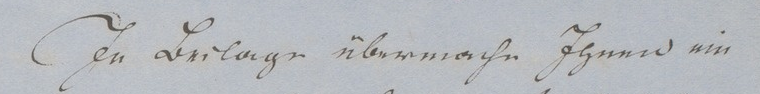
In Beilage übermache Ihnen ein
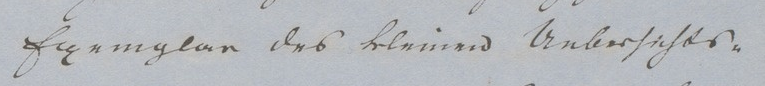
Exemplar des kleinen Uebersichts-
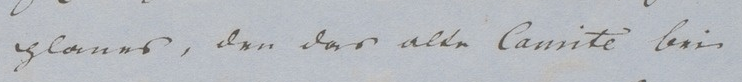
planes, den das alte Comite bei
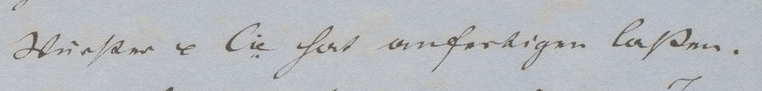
Würster & Cie hat anfertigen laßen.
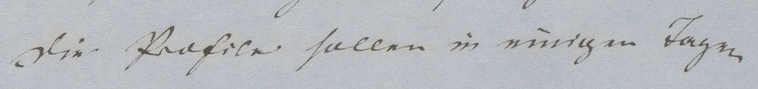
Die Profile sollen in einigen Tagen
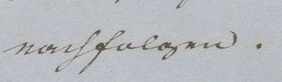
nachfolgen.
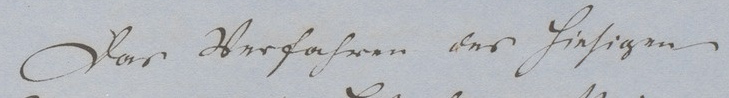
Das Verfahren des hiesigen
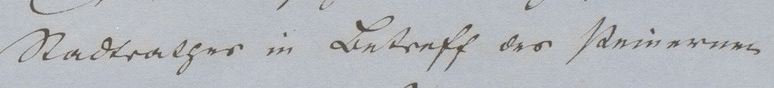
Stadtrathes in Betreff des steinernen
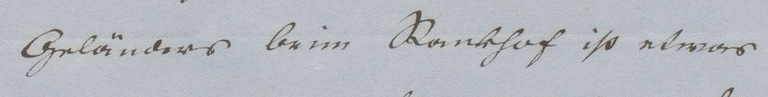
Geländers beim Rankhof ist etwas
